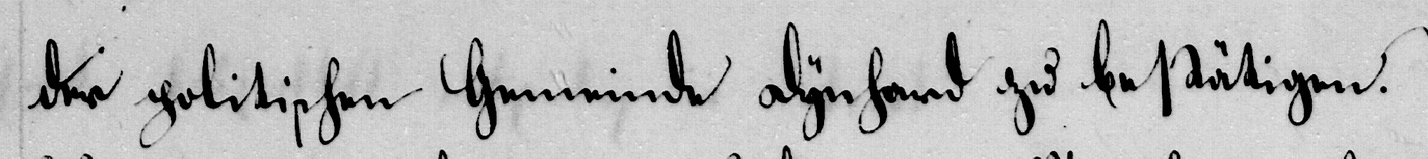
der politischen Gemeinde Dynhard zu bestätigen.
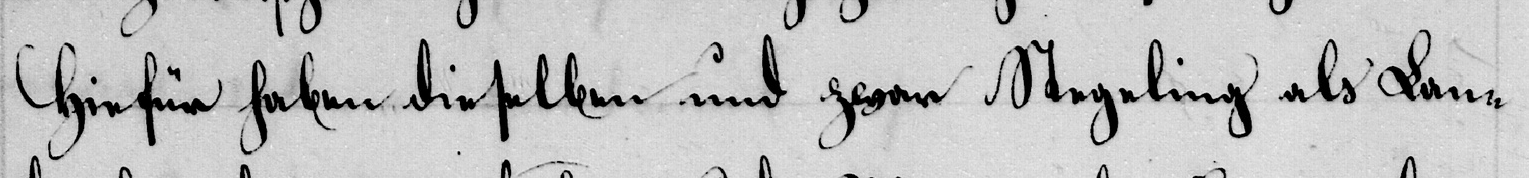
Hiefür haben dieselben und zwar Stegeling als Lan¬
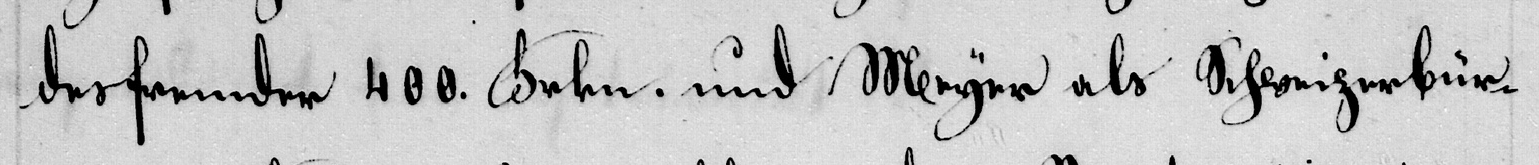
desfremder 400. Frkn. und Meyer als Schweizerbür¬
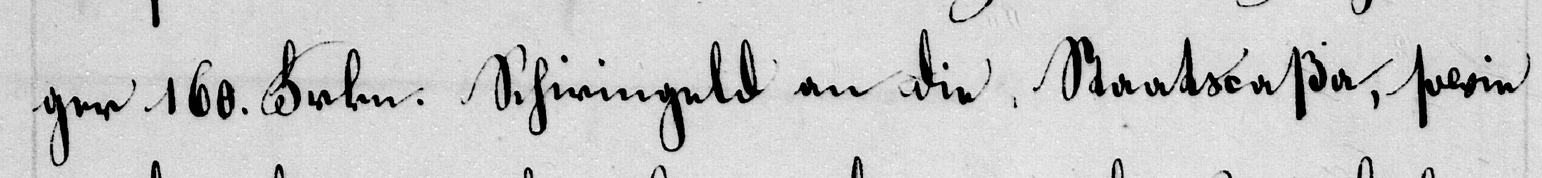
ger 160. Frkn. Schirmgeld an die Staatscaßa, sowie
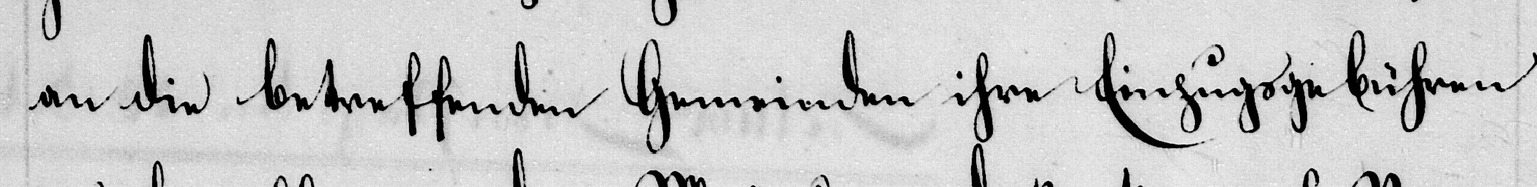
an die betreffenden Gemeinden ihre Einzugsgebühren
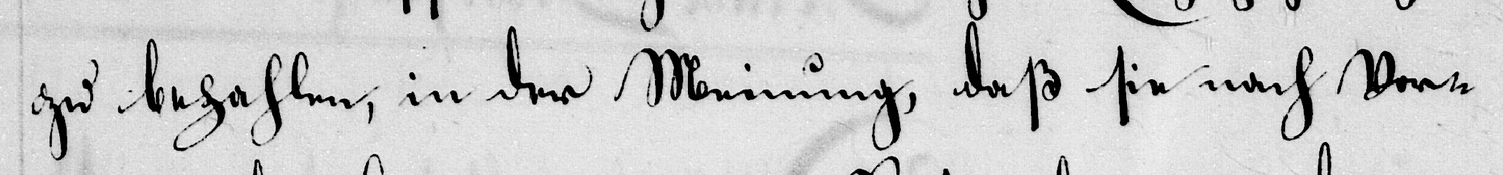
zu bezahlen, in der Meinung, daß sie nach Vor¬
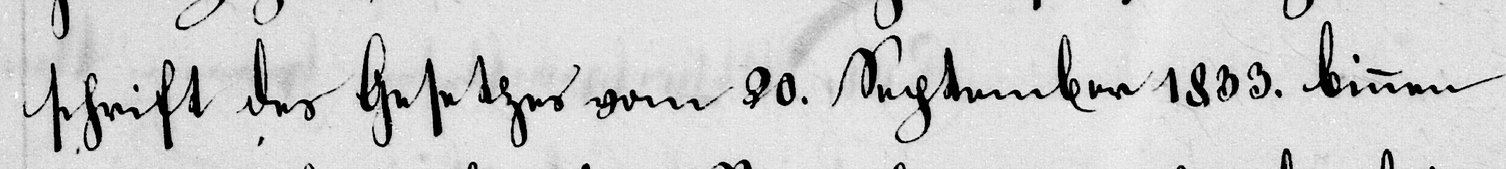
schrift des Gesetzes vom 20. September 1833. binnen
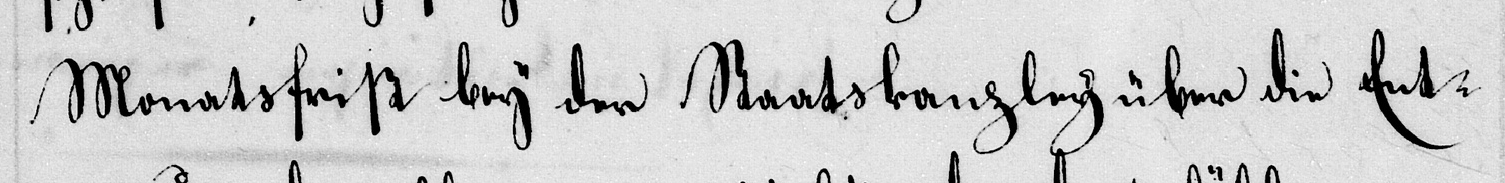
Monatsfrist bey der Staatskanzley über die Ent¬
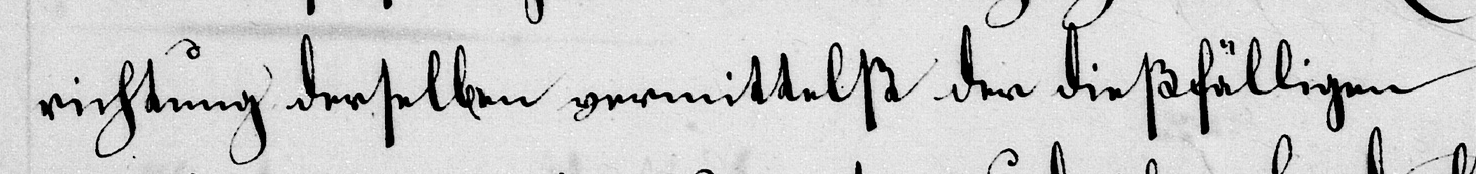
richtung derselben vermittelst der dießfälligen
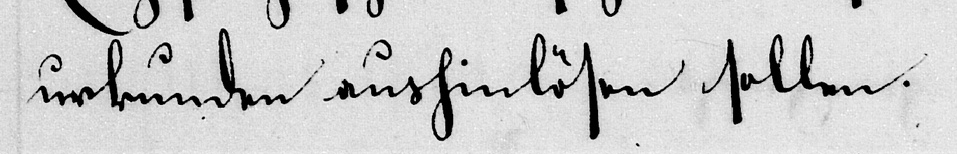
urkunden aushinlösen sollen.
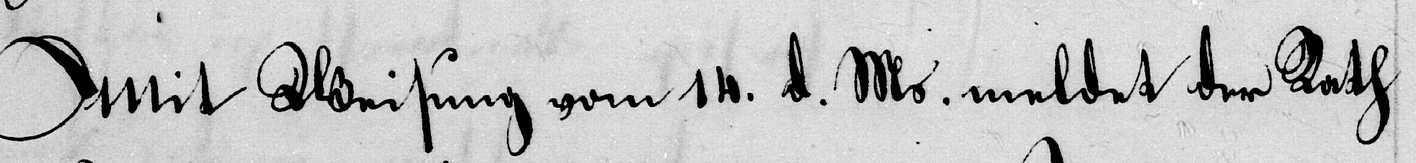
Mit Weisung vom 14. d. Ms. meldet der Rath
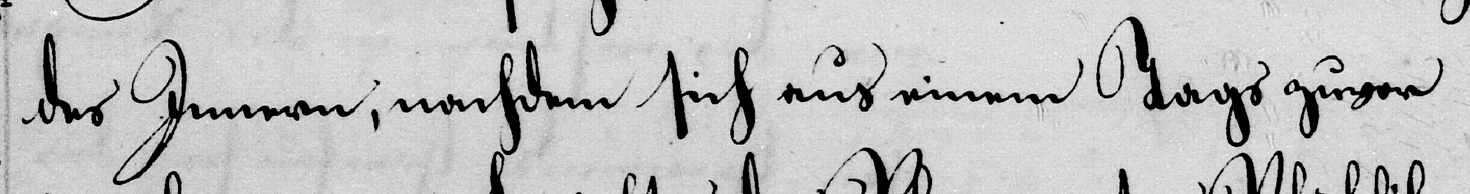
des Innern, nachdem sich aus einem Tags zuvor
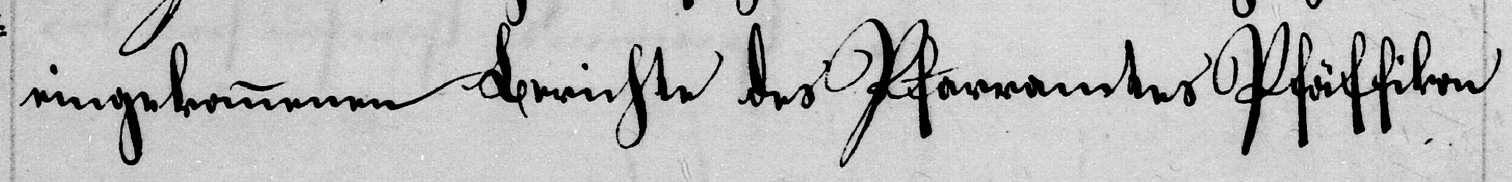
eingekommenen Berichte des Pfarramtes Pfäffikon
